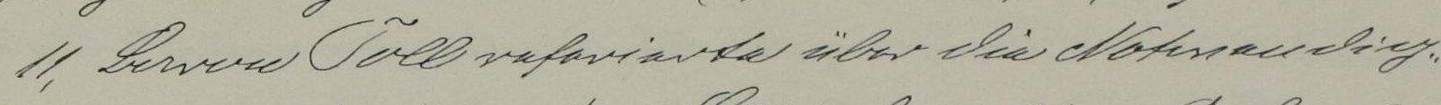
11. Baron Toll referierte über die Notwendig-
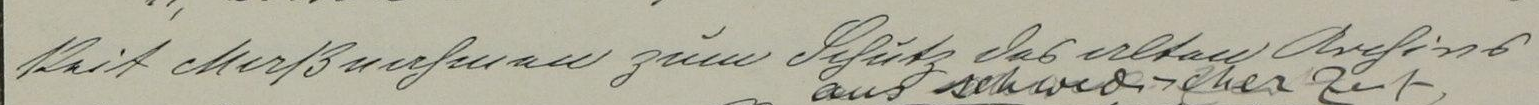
keit, Maßnahmen zum Schutz des alten Archivs
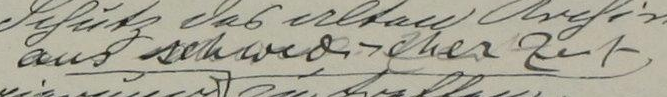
aus schwedischer Zeit
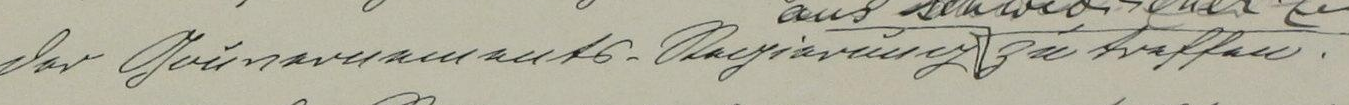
der Gouvernements-Regierung zu treffen.
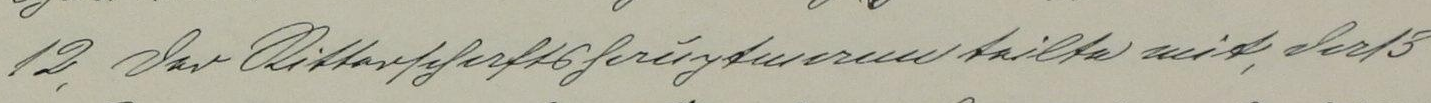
12. Der Ritterschaftshauptmann teilte mit, daß
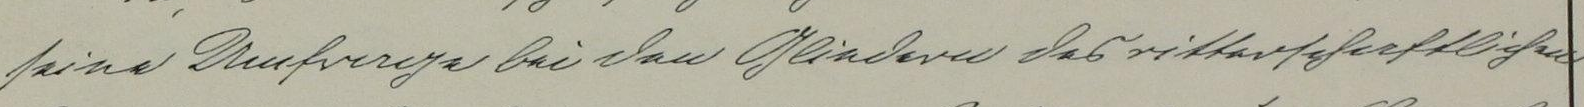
seine Umfrage bei den Gliedern des Ritterschaftlichen
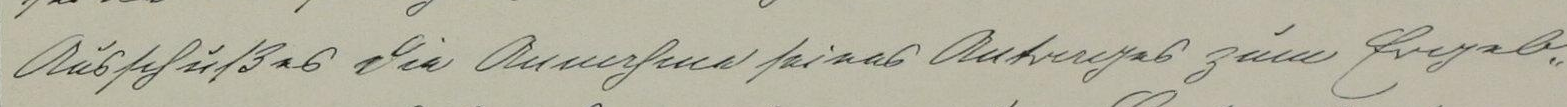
Ausschußes die Annahme seines Antrages zum Ergeb-
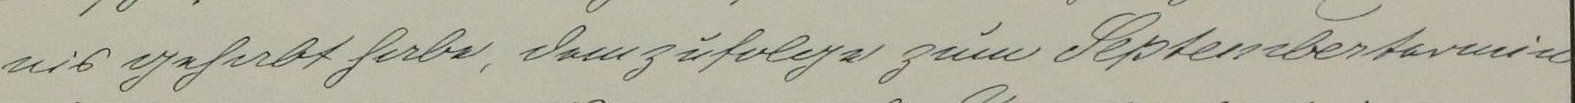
nis gehabt habe, demzufolge zum Septembertermin
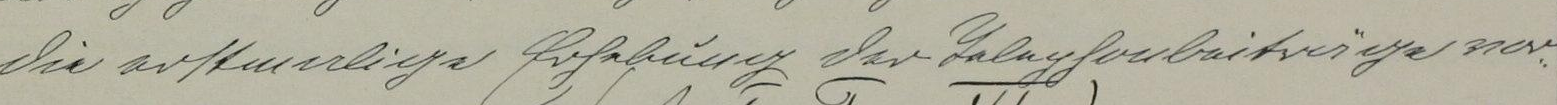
die erstmalige Erhebung der Telephonbeiträge vor-
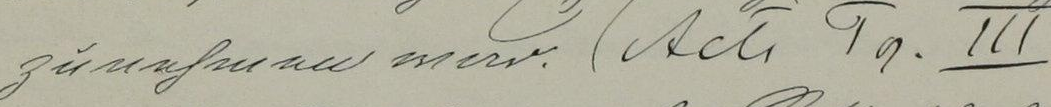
zunehmen war. (Acte T9. III)
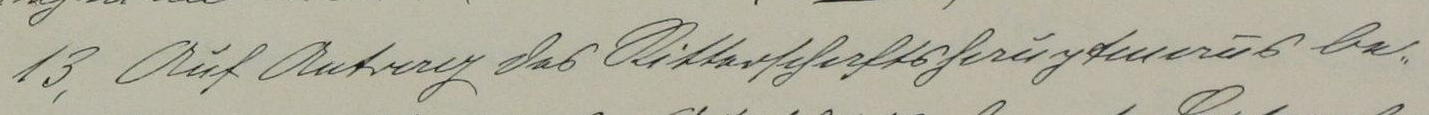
13. Auf Antrag des Ritterschaftshauptmanns be-
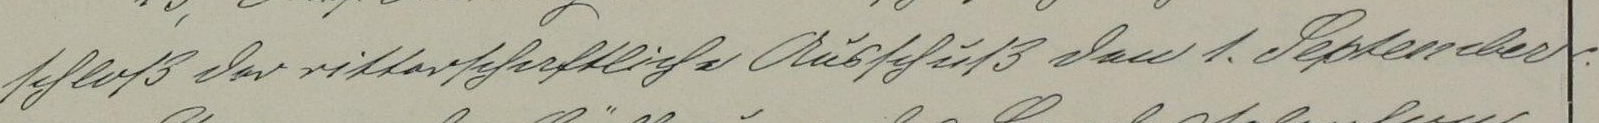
schloß der ritterschaftliche Ausschuß den 1. September
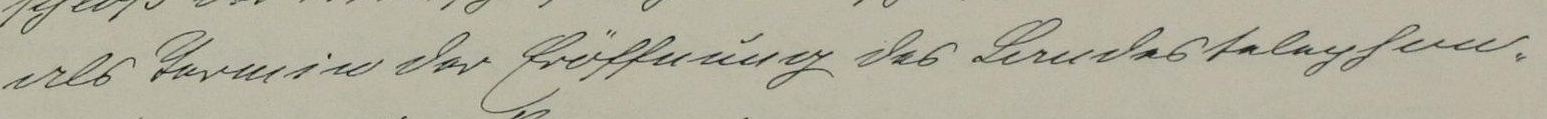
als Termin der Eröffnung des Landestelephon-
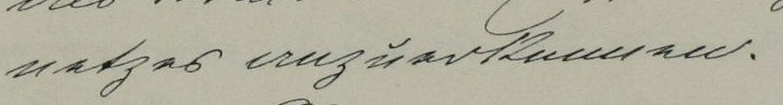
netzes anzuerkennen.
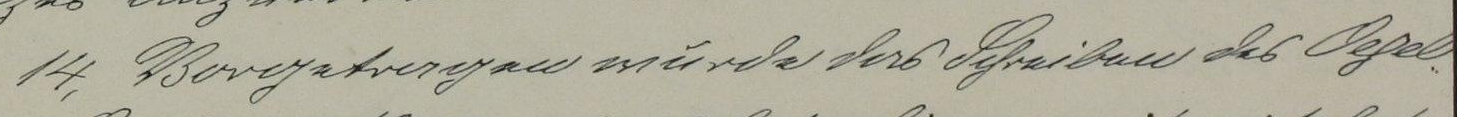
14. Vorgetragen wurde das Schreiben des Oesel-
